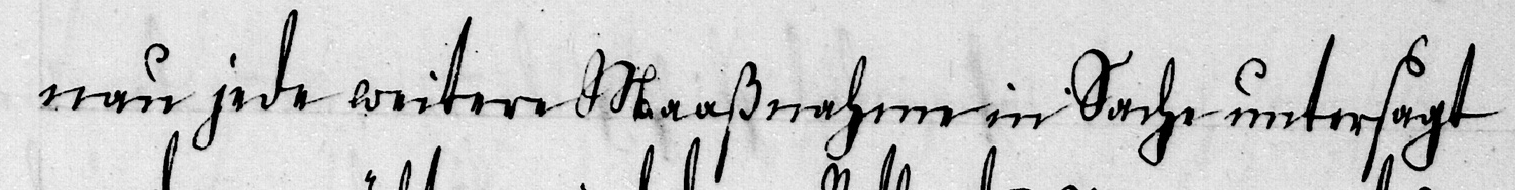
nau jede weitere Maaßnahme in Sache untersagt
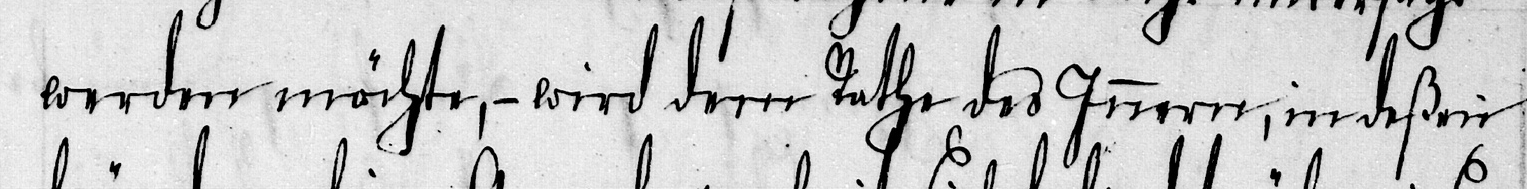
werden möchte, – wird dem Rathe des Innern, in deßen
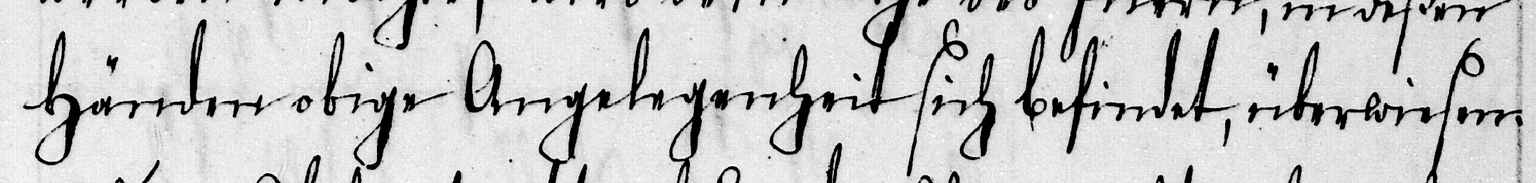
Händen obige Angelegenheit sich befindet, überwiesen.
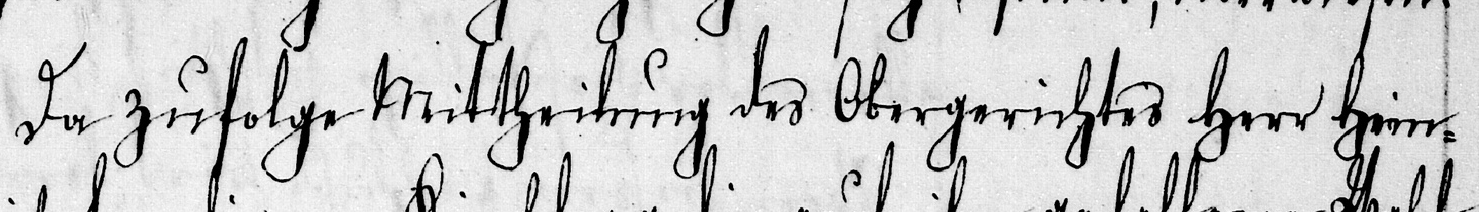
Da zufolge Mittheilung des Obergerichtes Herr Hein¬
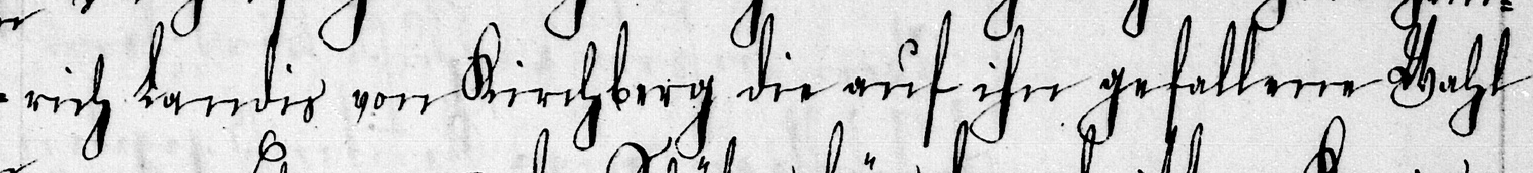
rich Landis von Kirchberg die auf ihn gefallene Wahl
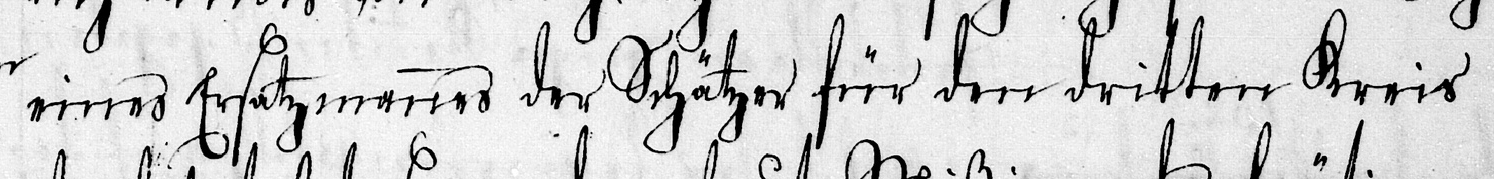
eines Ersatzmannes der Schätzer für den dritten Kreis
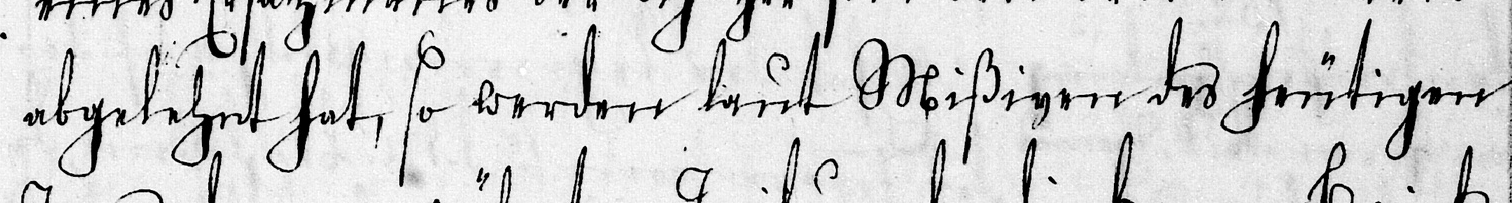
abgelehnt hat, so werden laut Mißiven des heutigen
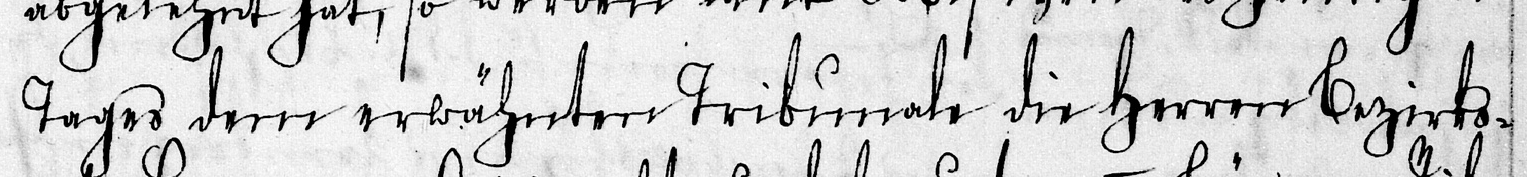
Tages dem erwähnten Tribunale die Herren Bezirks¬
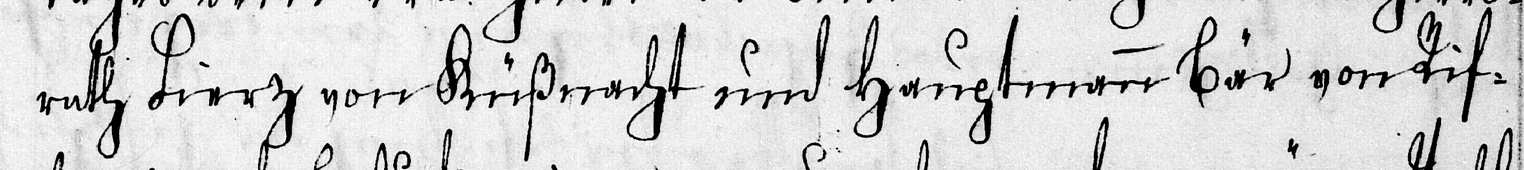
rath Fierz von Küßnacht und Hauptmann Bär von Rif¬
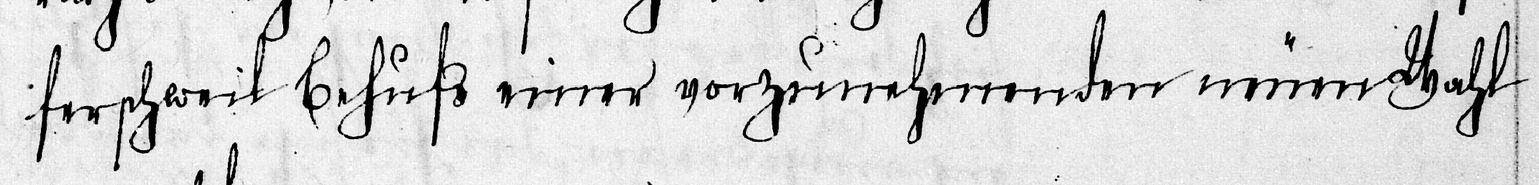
ferschweil Behufs einer vorzunehmenden neuen Wahl
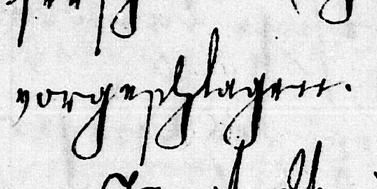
vorgeschlagen.
